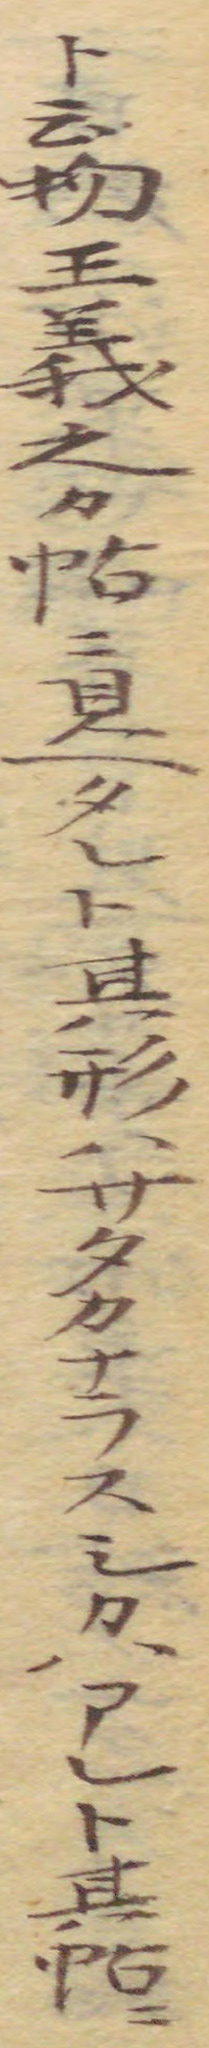ト云物王義之カ帖ニ見ヘタレト其形ハサタカナラスシカハアレト其帖ニ
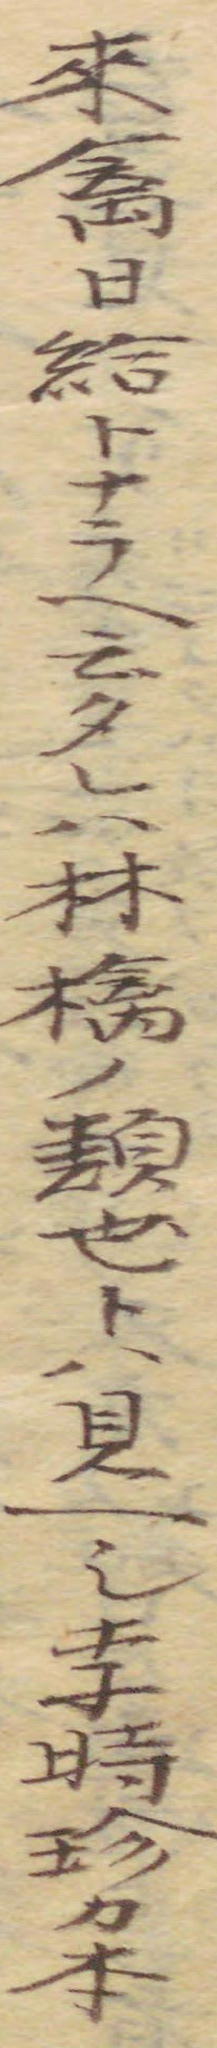来禽日給トナラヘ云タレハ林檎ノ類トハ見ヘシ李時珍カ本
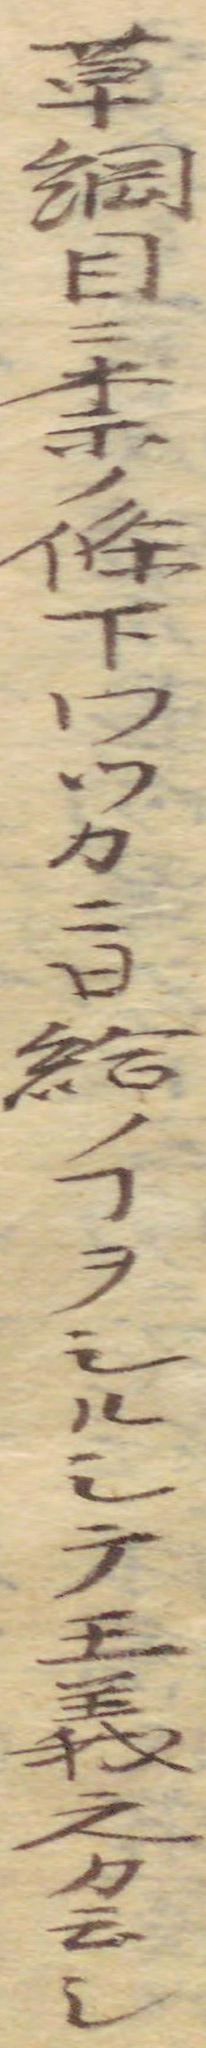草綱目ニ柰ノ條下ワツカニ日給ノコトヲシルシテ王羲之カ云シ
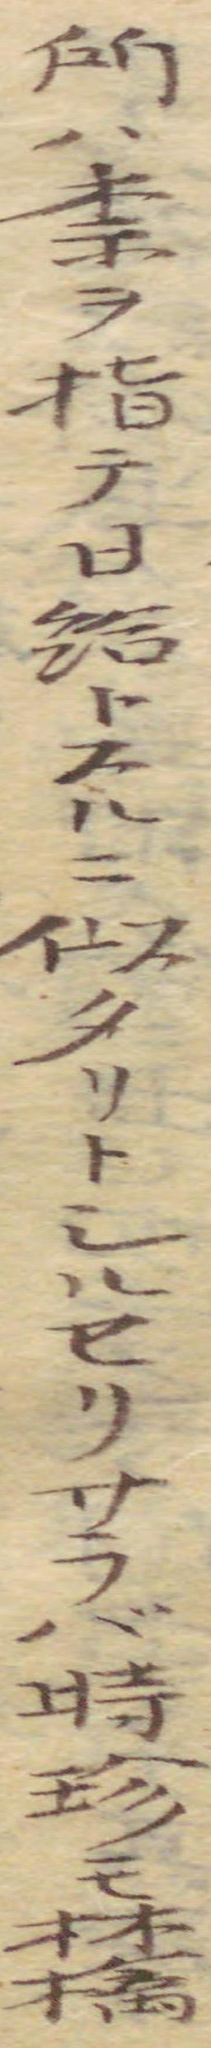所ハ柰ヲ指テ日給トスルニ似タリトシルセリサラバ時珍モ林檎
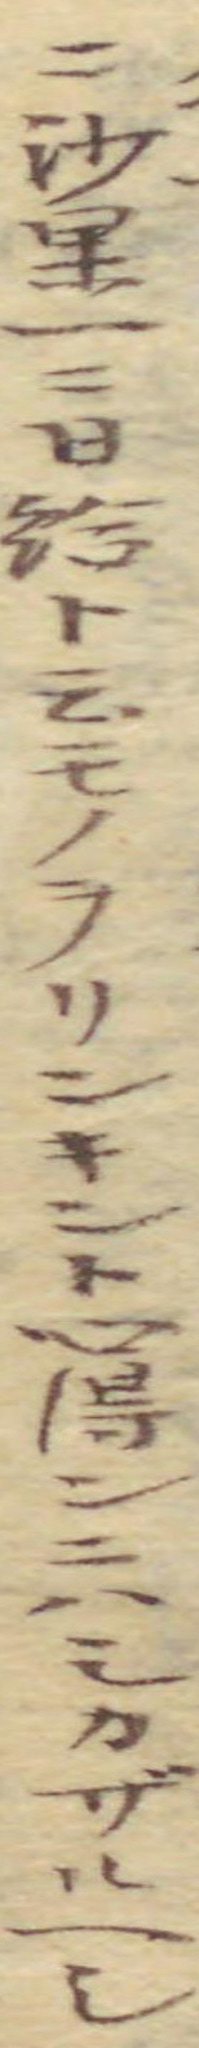ニ沙果一ニ日給ト云モノヲリンキント心得ンニハシカザルヘシ
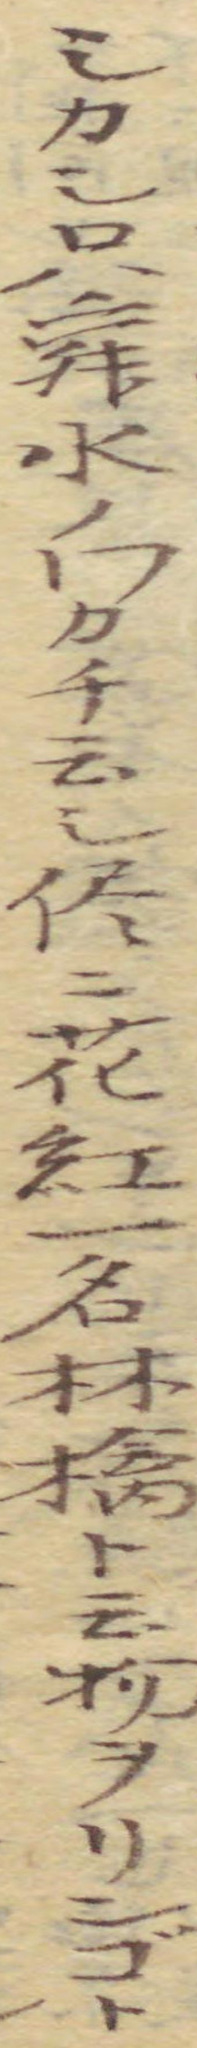シカシ只舜水ノワカチ云シ侭ニ花紅一名林檎ト云物ヲリンゴト
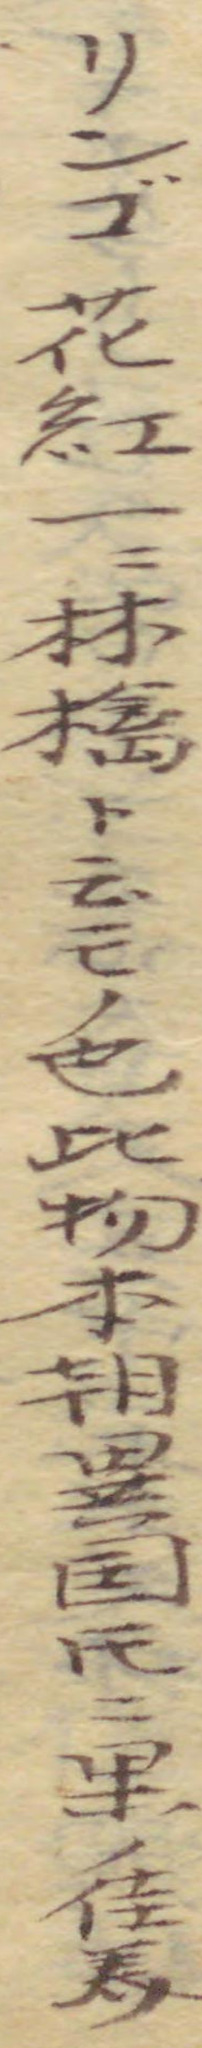リンゴ花紅一ニ林檎ト云モノ也此物本朝異国トモニ果ノ佳美
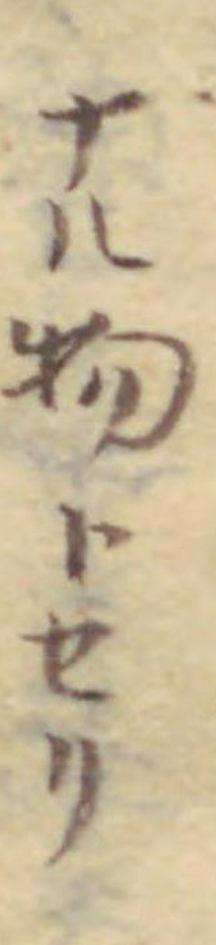ナル物トセリ
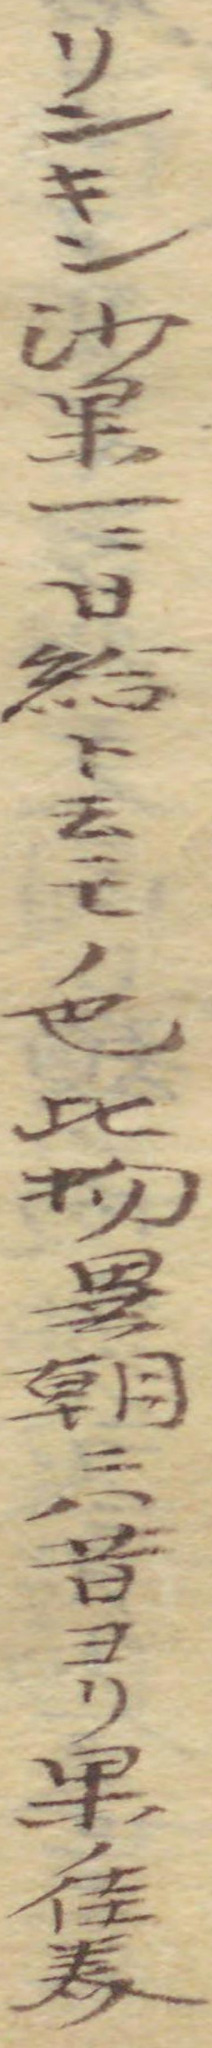リンキン沙果一ニ日給ト云モノ也此物異朝ニハ昔ヨリ果ノ佳美
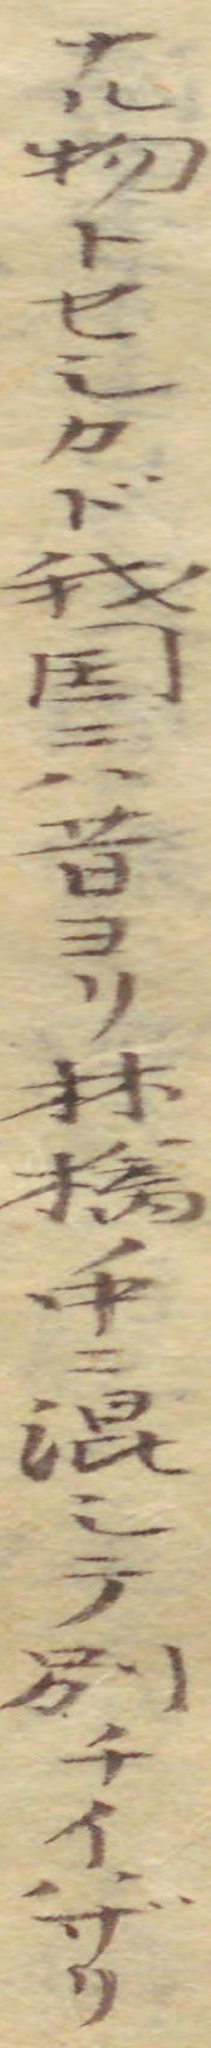ナル物トセシカド我国ニハ昔ヨリ林檎ノ中ニ混シテ別チイハザリ
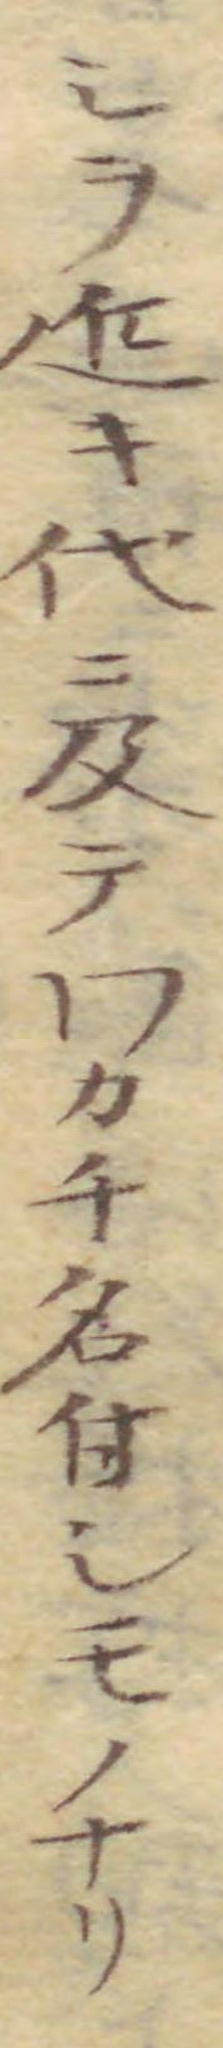シヲ近キ代ニ及テワカチ名付シモノナリ
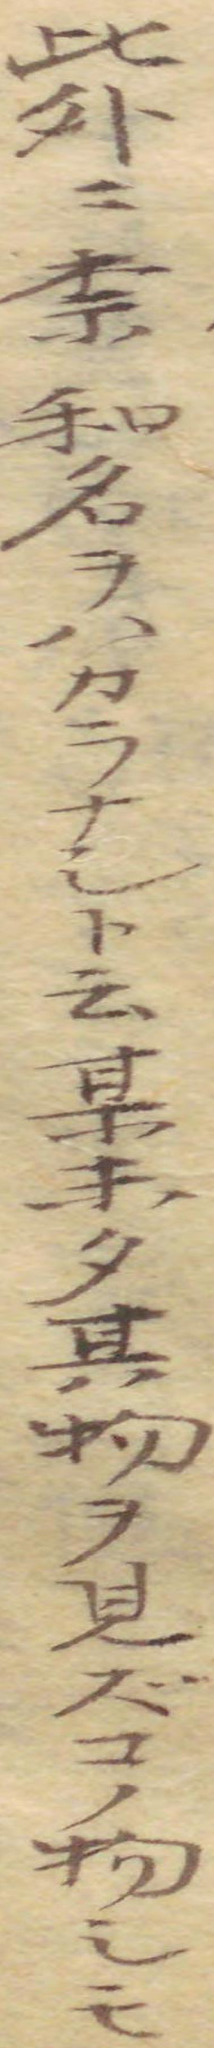此外ニ柰和名ヲハカラナシト云未タ其物ヲ見ズコノ物シモ
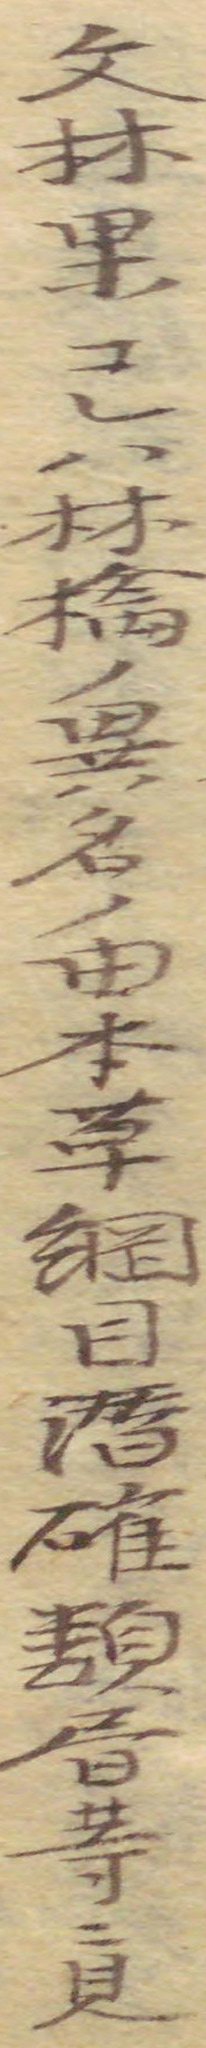文林果コレハ林檎ノ異名ノ由本草綱目潜確類書等ニ見
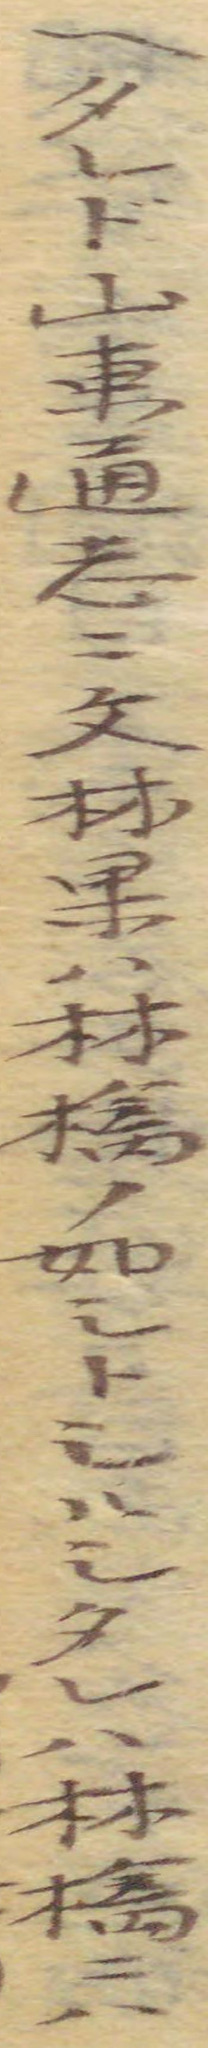ヘタレド山東通志ニ文林果ハ林檎ノ如シトシルシタレハ林檎ニハ

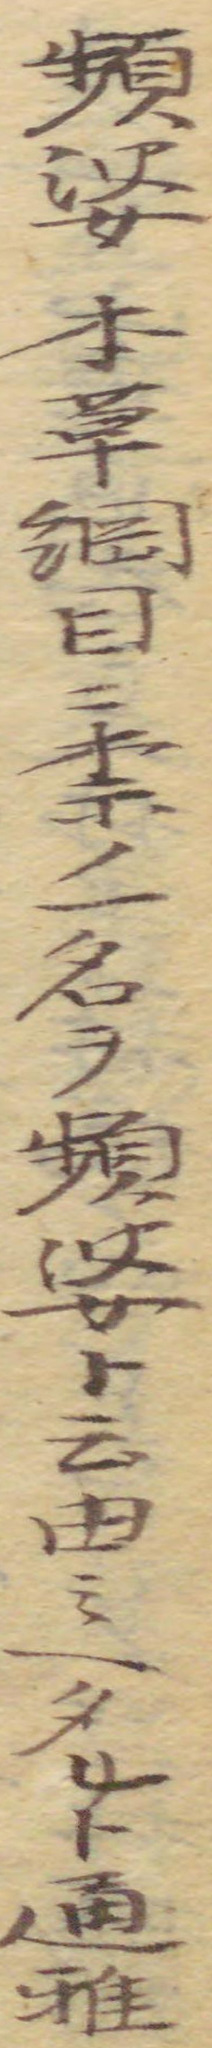頻婆本草綱目ニ柰ノ一名ヲ頻婆ト云由ミヘタレト通雅
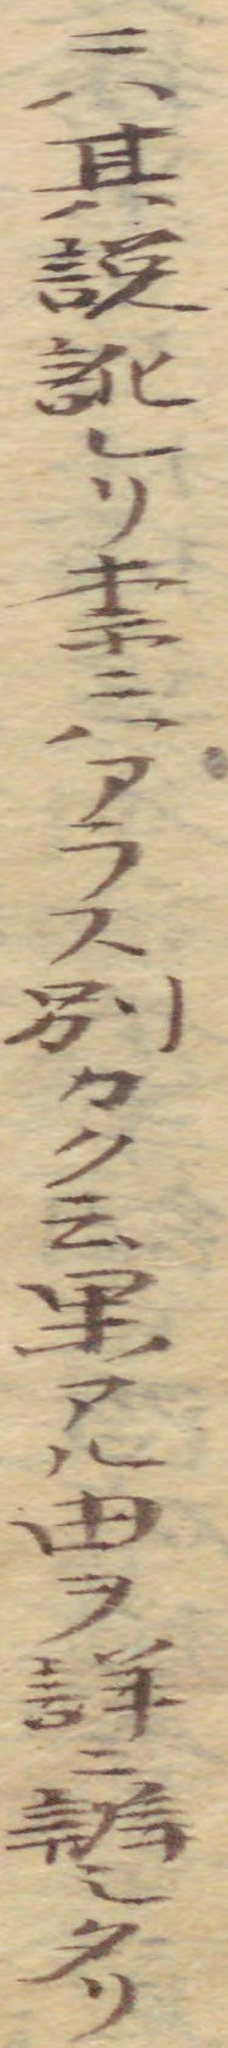ニハ其説訛レリ柰ニハアラス別カク云果アル由ヲ詳ニ弁シタリ
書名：鶯宿雑記. 巻263-264
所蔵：国立国会図書館 National Diet Library, JAPAN
